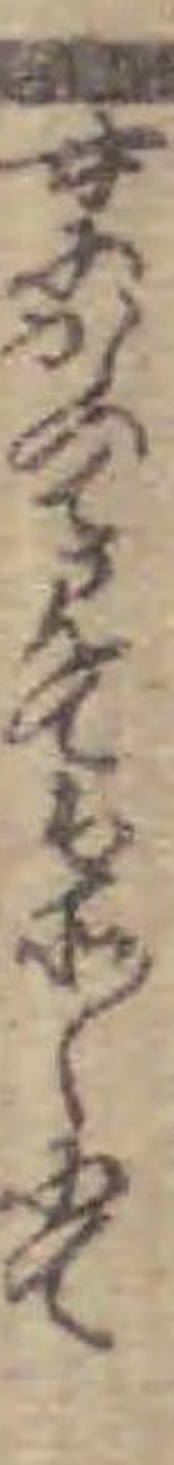女にかへて見ても所〳〵にて
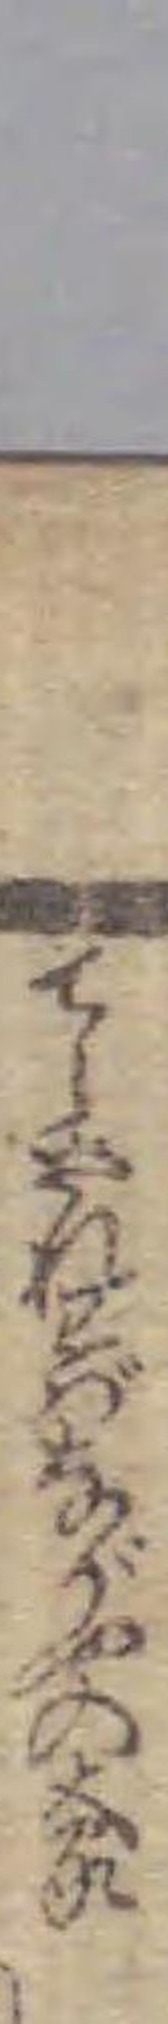ちらされればながやの大家
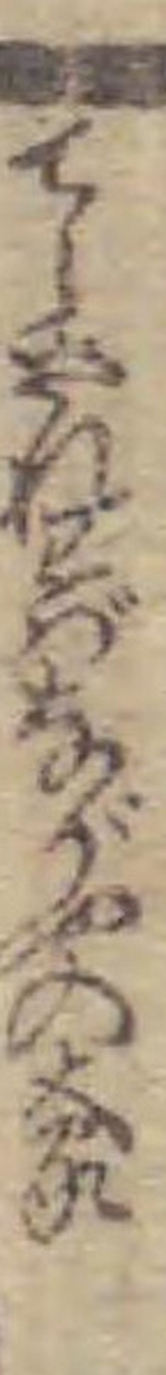ちらされればながやの大家
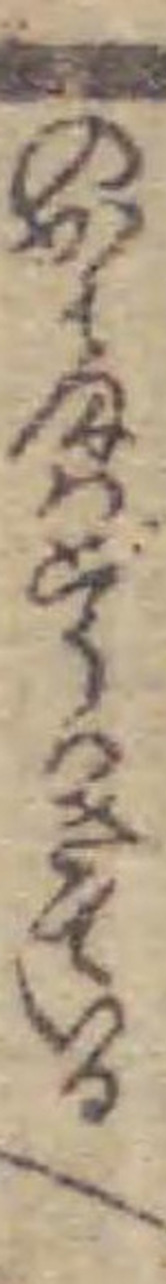のかもはどうつきている
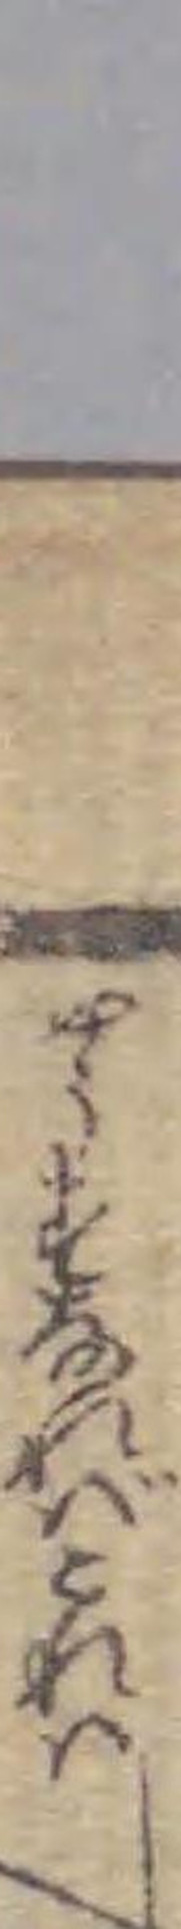やうすなればこれは
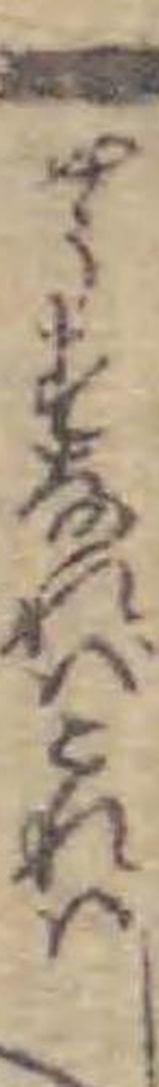やうすなればこれは
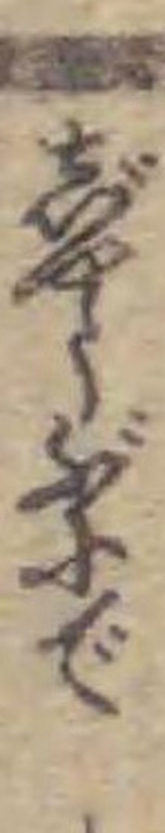じやうぶにで
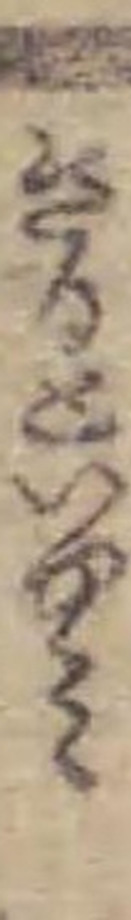きるといやミ
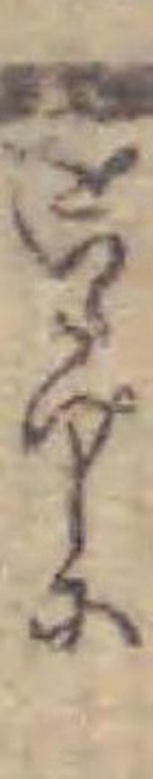をいたしに
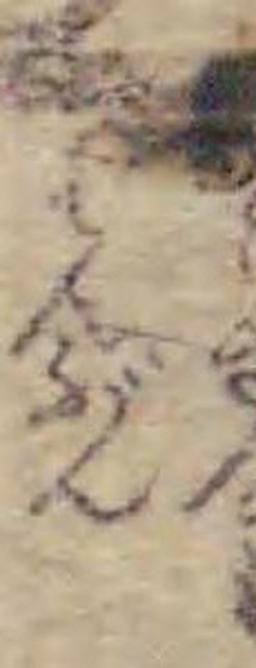はんぶん
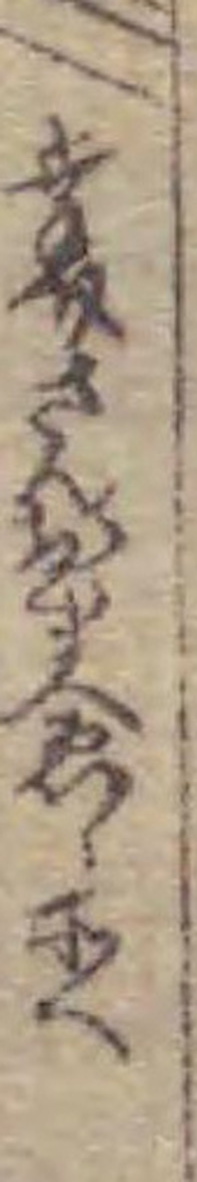幸介さんおまへゑゝ処へ
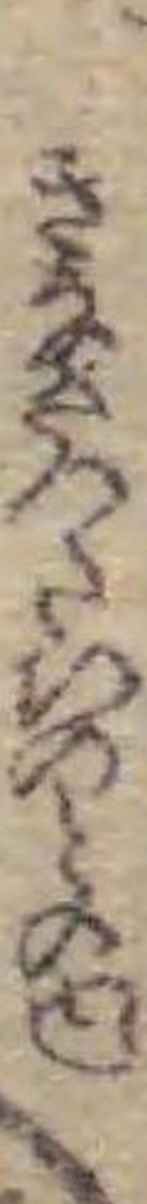きなさつたいのとの内
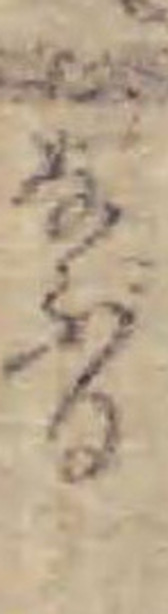なふる
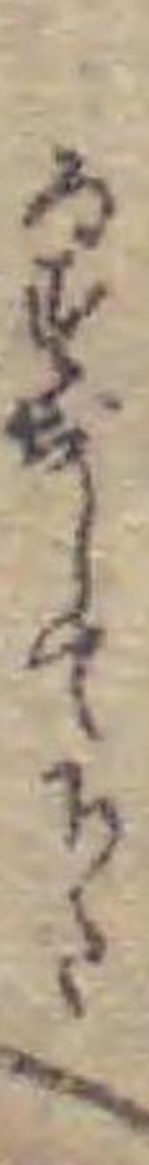るす居して下た
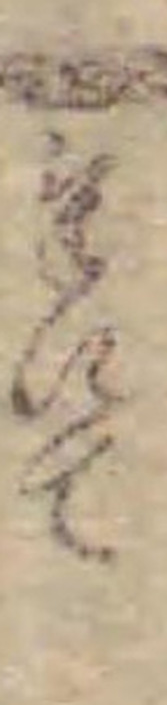きにて
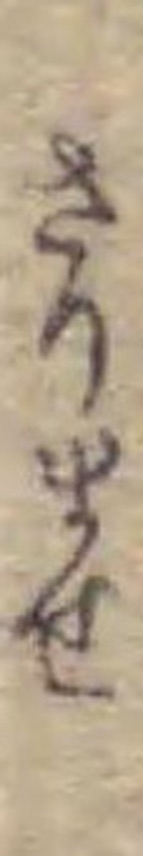さりませ
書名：通風伊勢物語 : 3巻
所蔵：国立国会図書館 National Diet Library, JAPAN
